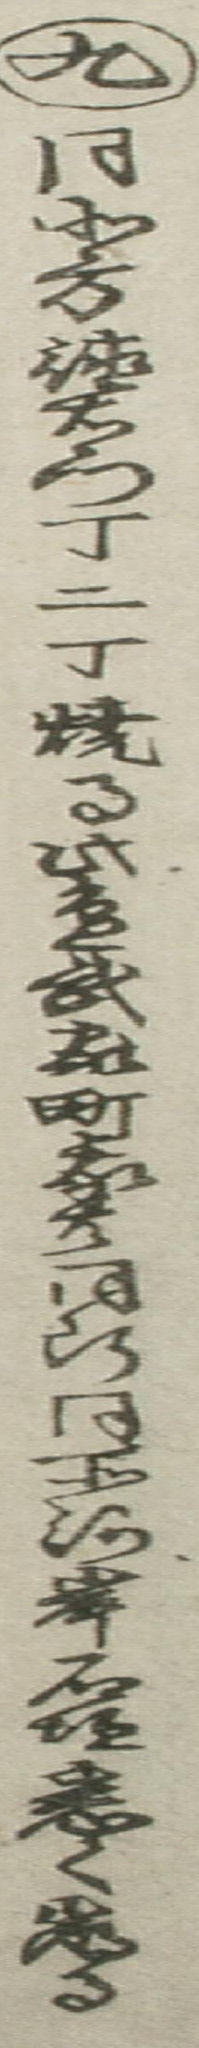同北方徳右衛門丁二丁焼る此辺武家町家共同断同所河岸石垣悉く崩る
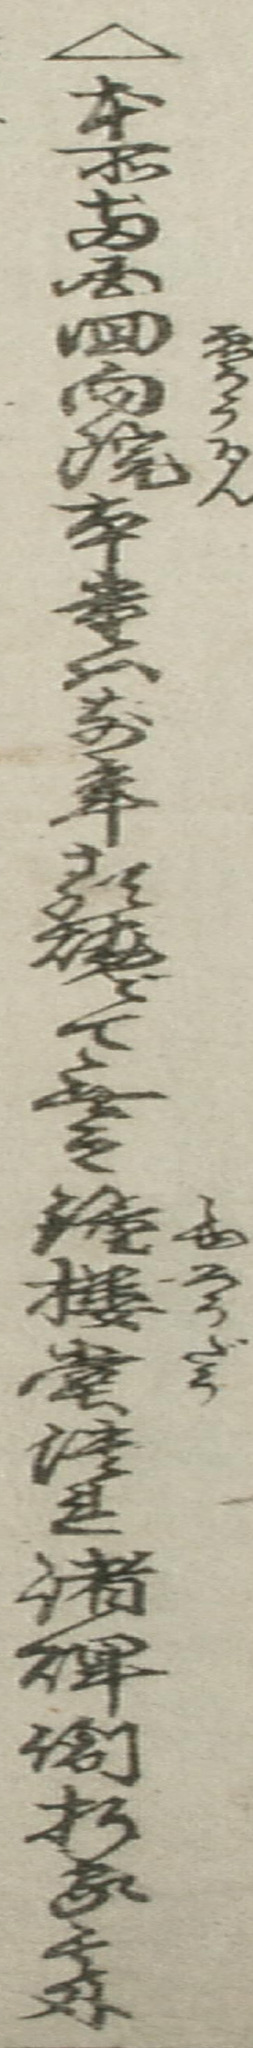△本所両国回向院本堂は前年類焼にて無之鐘楼堂潰れ諸碑倒折家其外
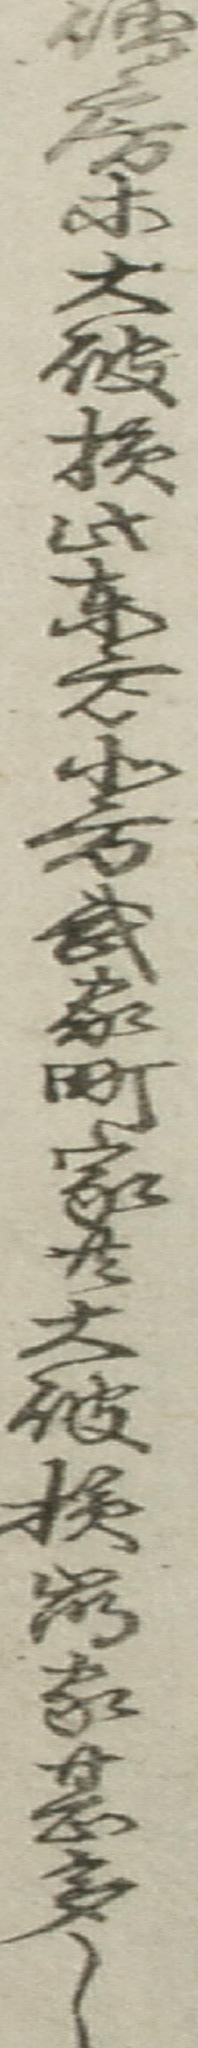僧房等大破損此東方北方武家町家共大破損崩家甚多し
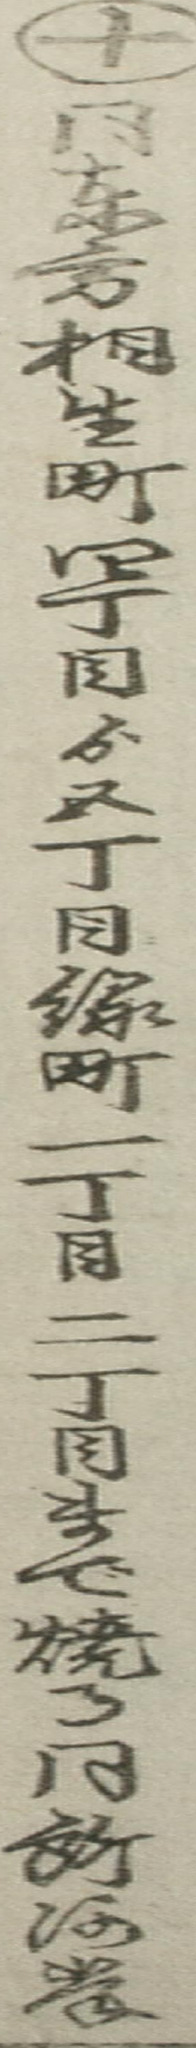同東方相生町四丁目ゟ五丁目緑町一丁目二丁目まで焼る同所河岸
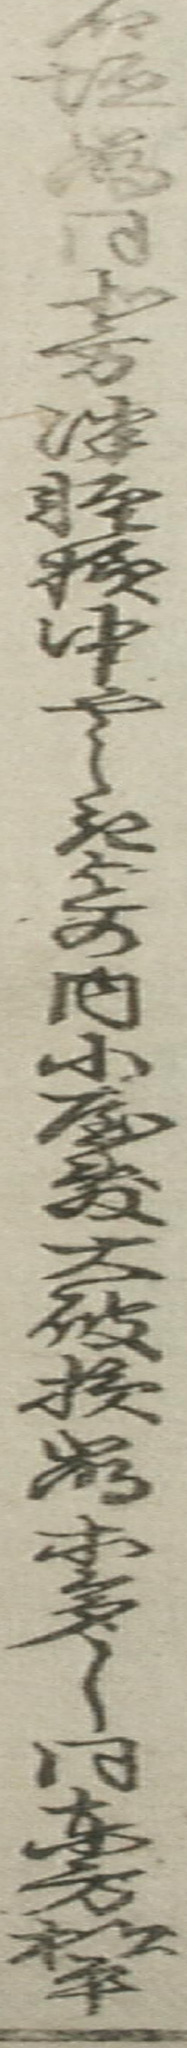石垣崩同北方津軽様中やしき迄の内小屋敷大破損崩等多し同東方松平
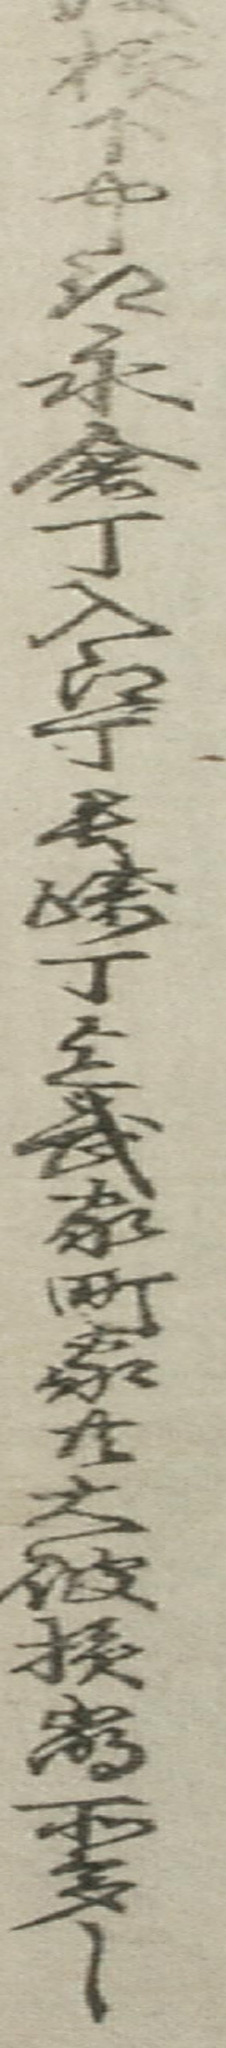筑後様下やしき永倉丁入江丁長崎丁迄武家町家共大破損崩所多し
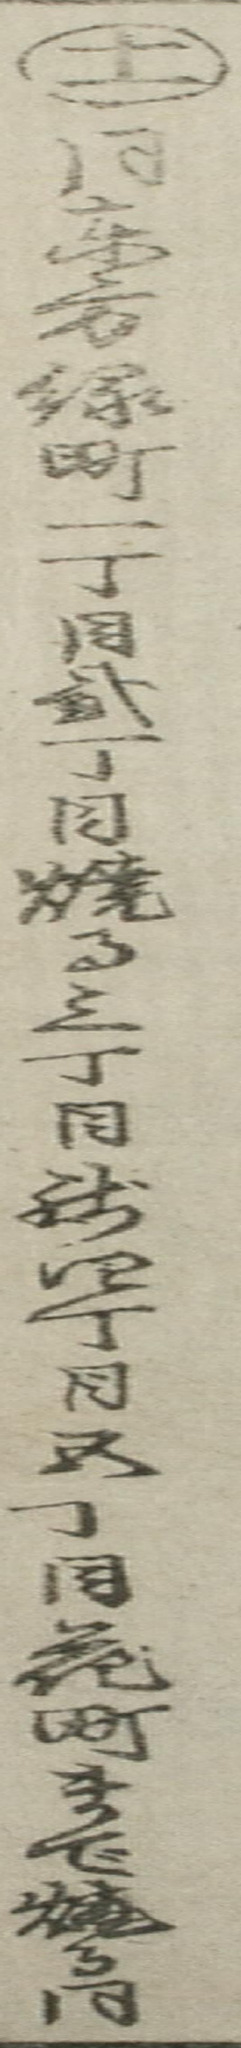同東方緑町一丁目弐丁目焼る三丁目残四丁目五丁目花町まで焼る同
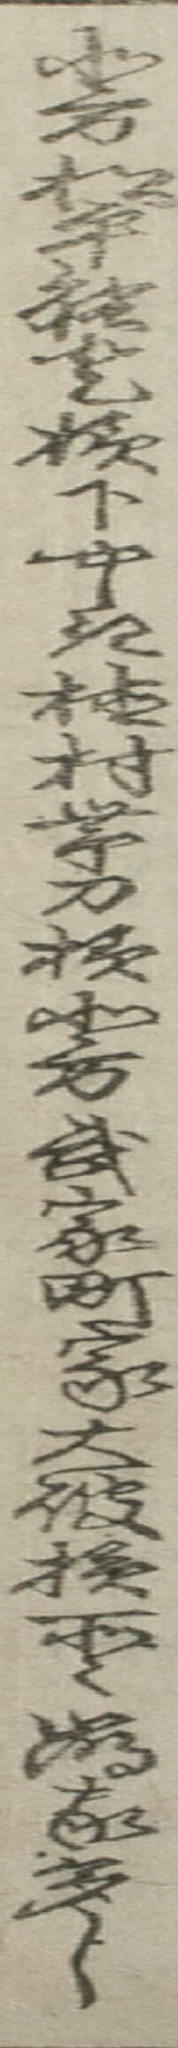北方松平能登様下やしき植村帯刀様北方武家町家大破損所〻崩家多し
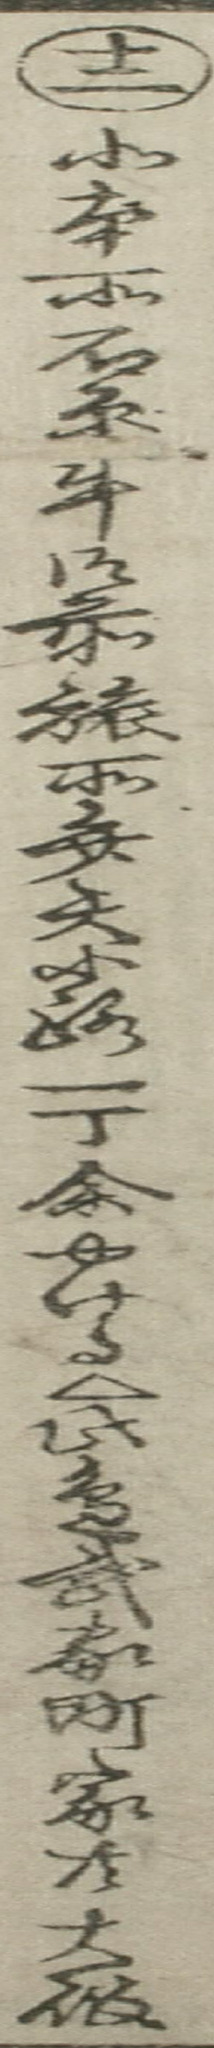北本所石原牛御前旅所弁天小路一丁余やける△此辺武家町家共大破
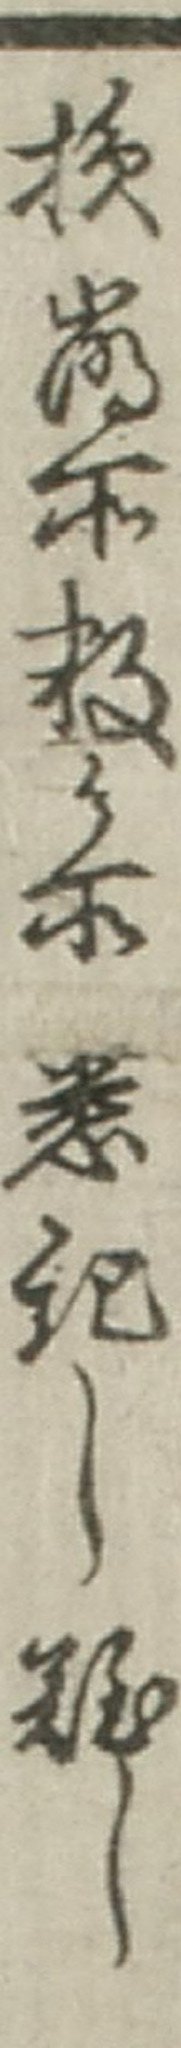損崩所数ヶ所悉記し難し

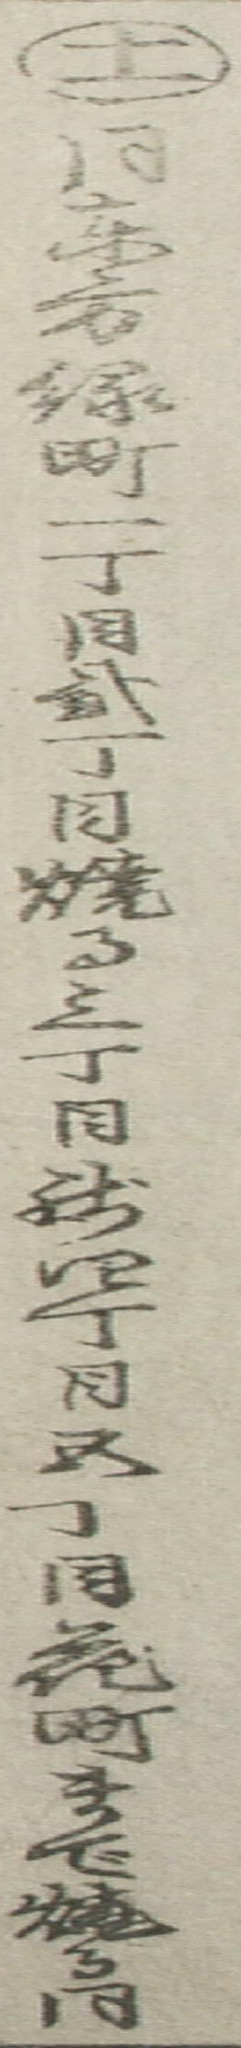同東方緑町一丁目弐丁目焼る三丁目残四丁目五丁目花町まで焼る同
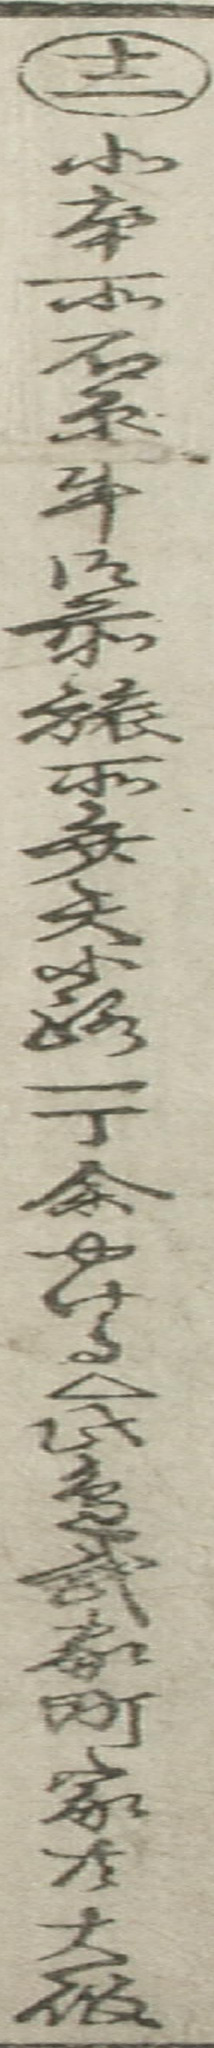北本所石原牛御前旅所弁天小路一丁余やける△此辺武家町家共大破

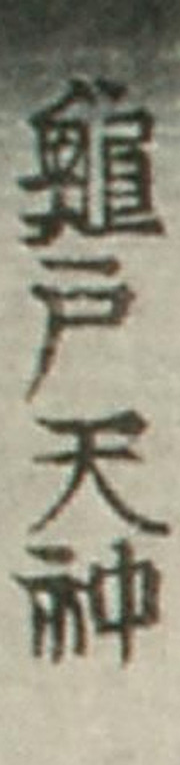亀戸天神

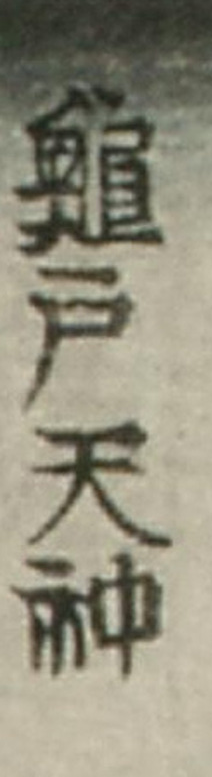亀戸天神
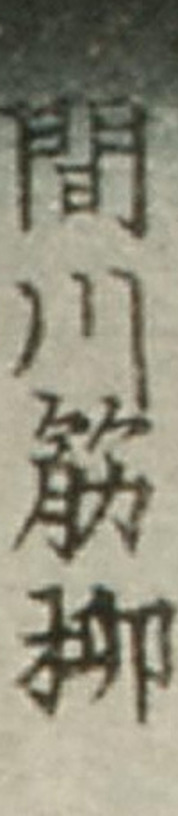間川筋柳
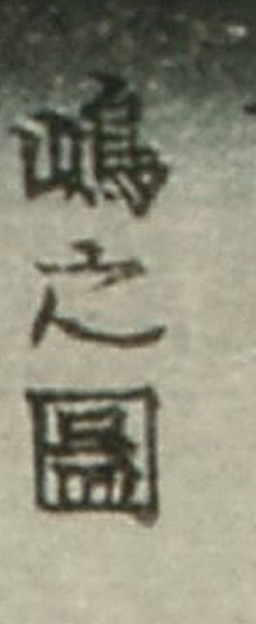嶋之図
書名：安政見聞誌　上
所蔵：東京大学地震研究所図書室 Earthquake Research Institute Library, The University of Tokyo, JAPAN
